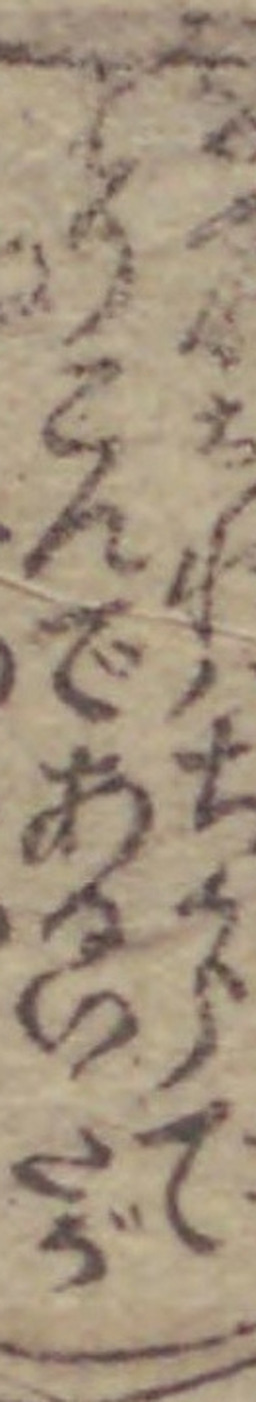はりこんであるいたが
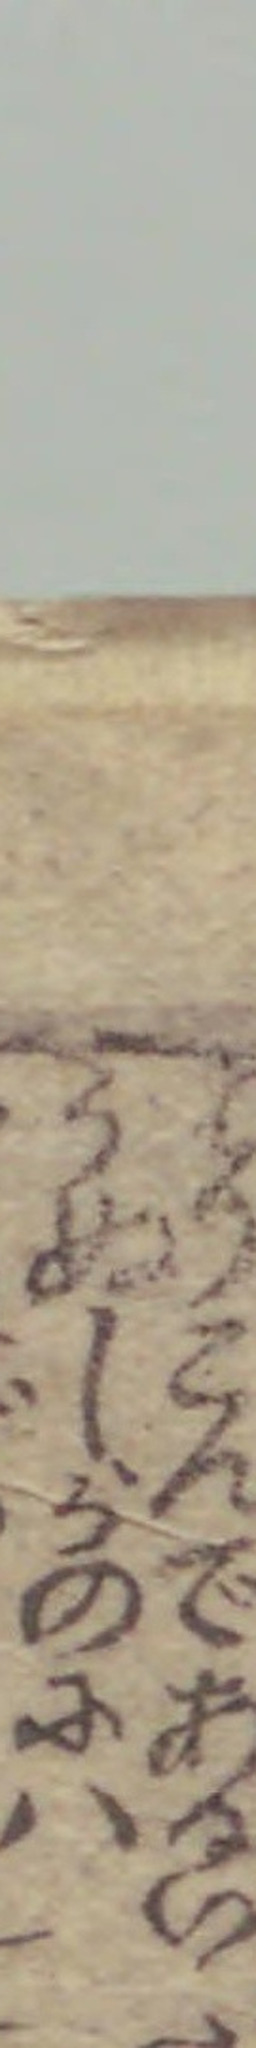うぬしらのには
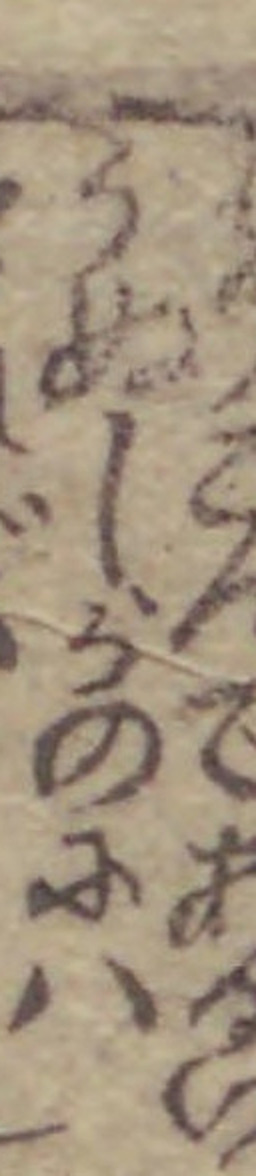うぬしらのには
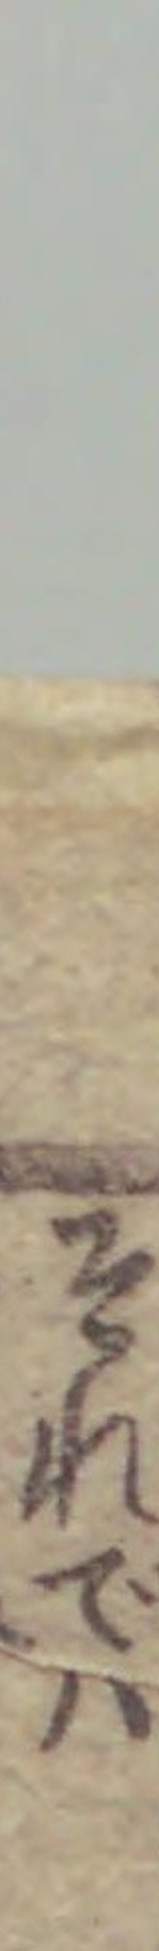それでは
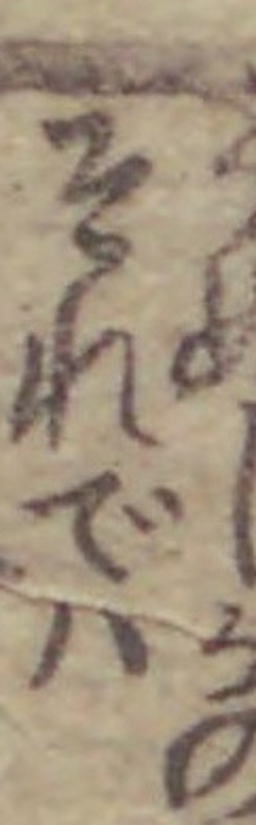それでは
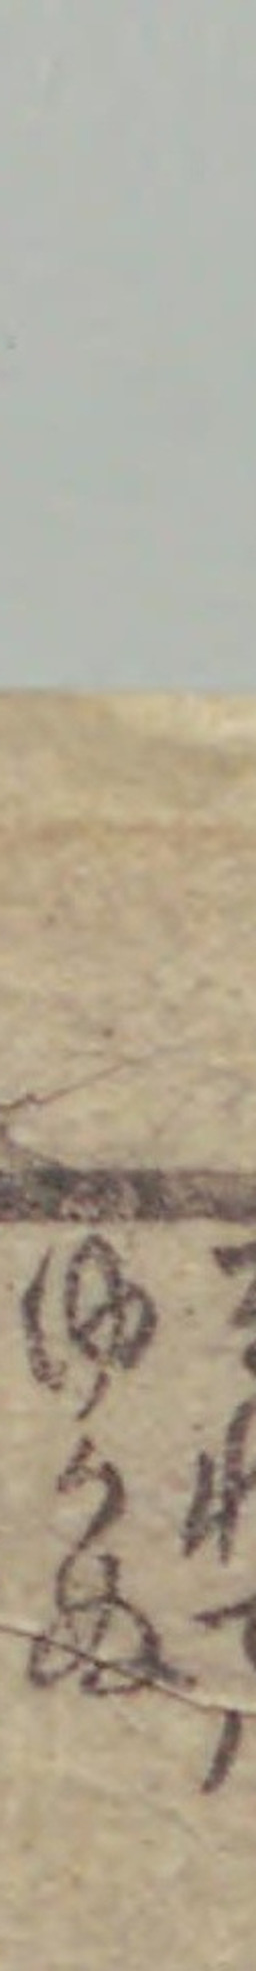ゆかぬ
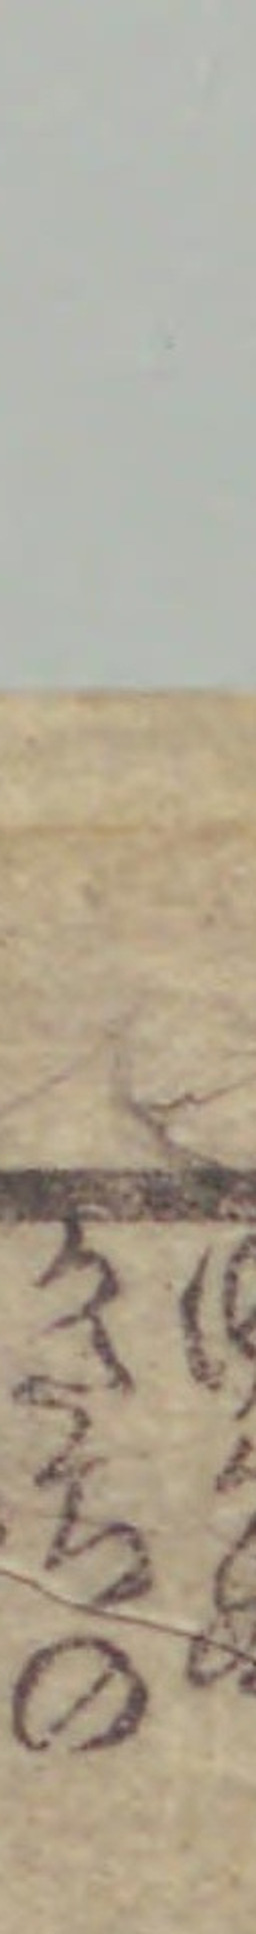かたちの
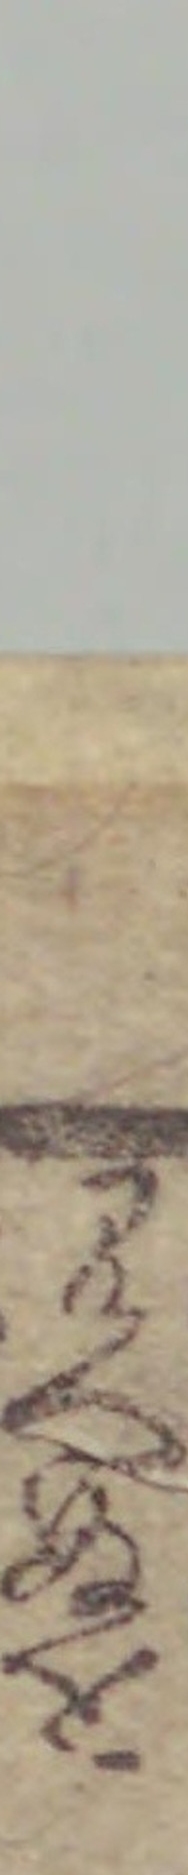見へぬを
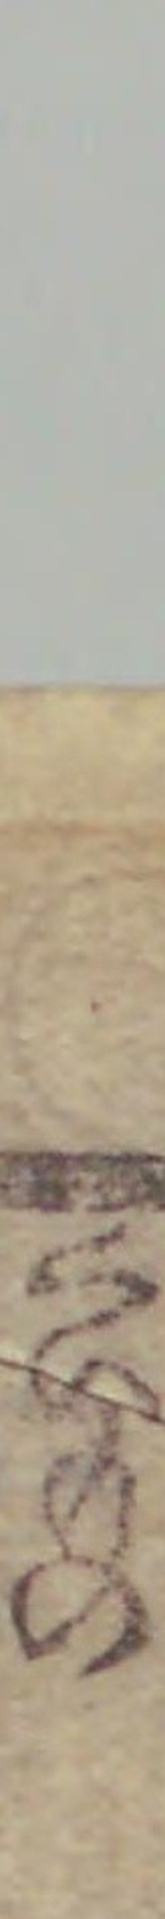くいもの

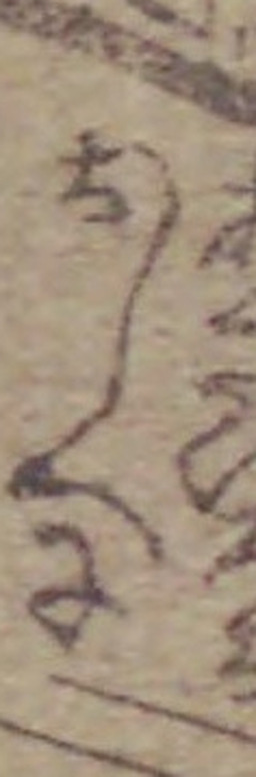おしへに
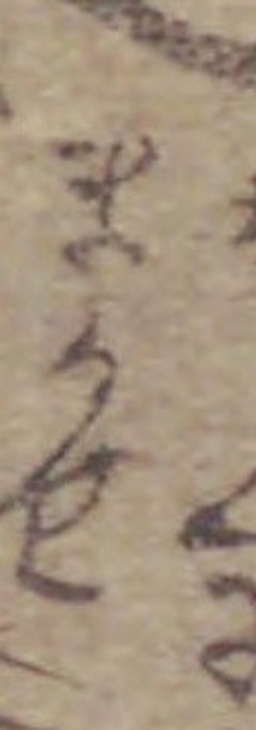まかせ
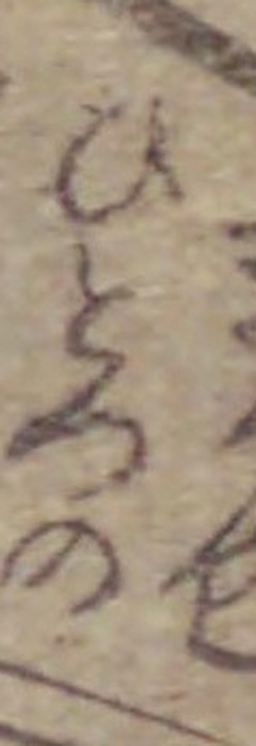ひとつの
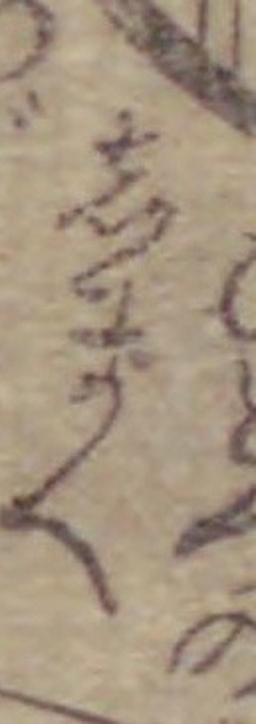しまへ
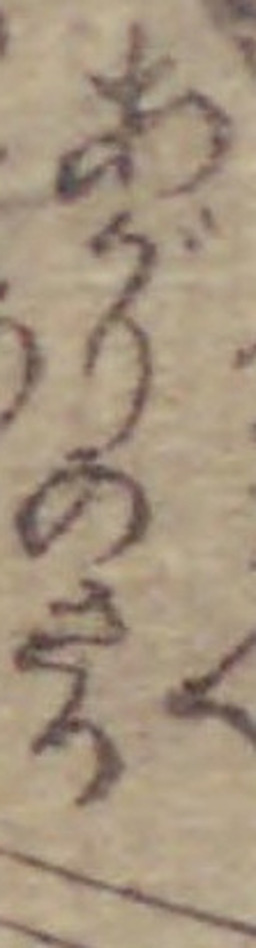あがりのさり
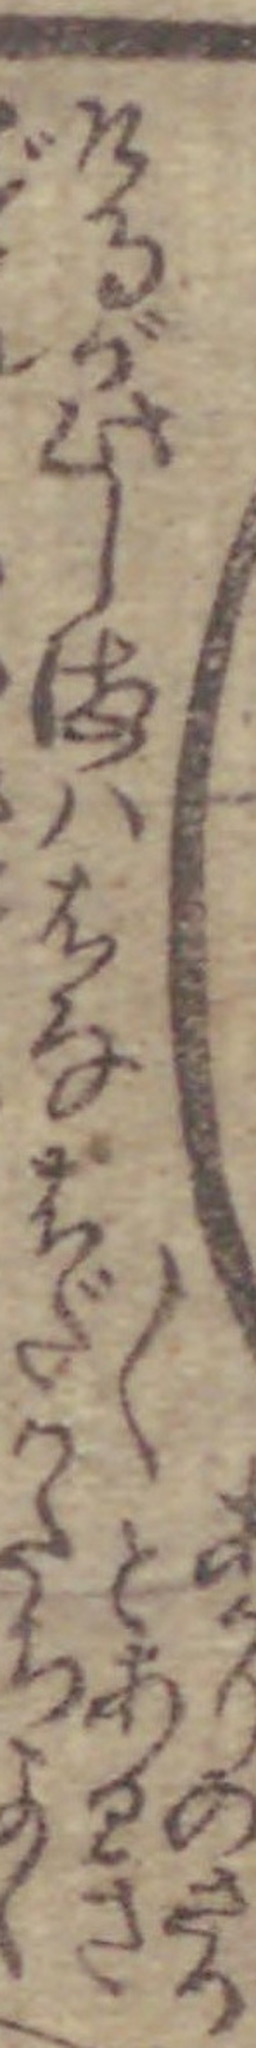けるが此しまははなはだかたちよく
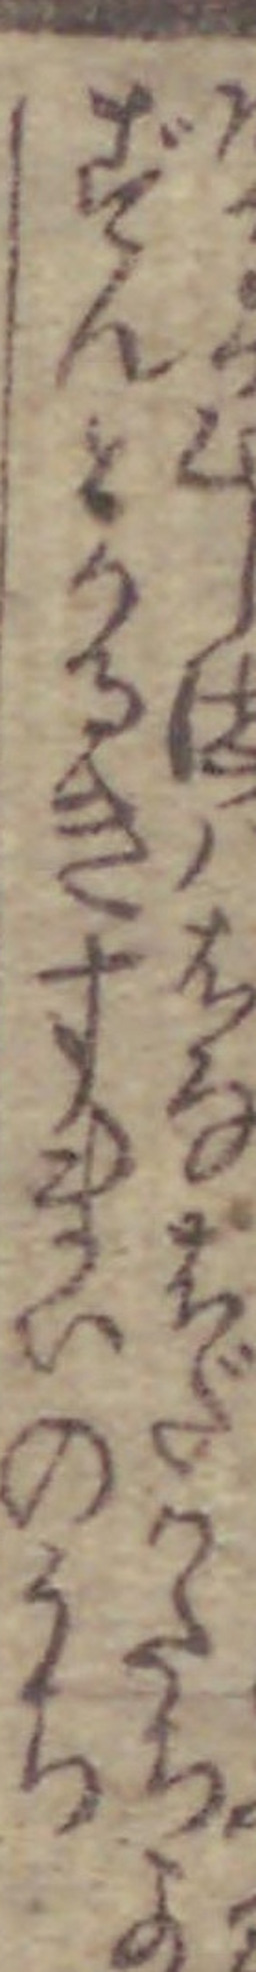ずんとかるきすまいのうち
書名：近頃嶋めぐり 3巻
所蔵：国立国会図書館 National Diet Library, JAPAN
